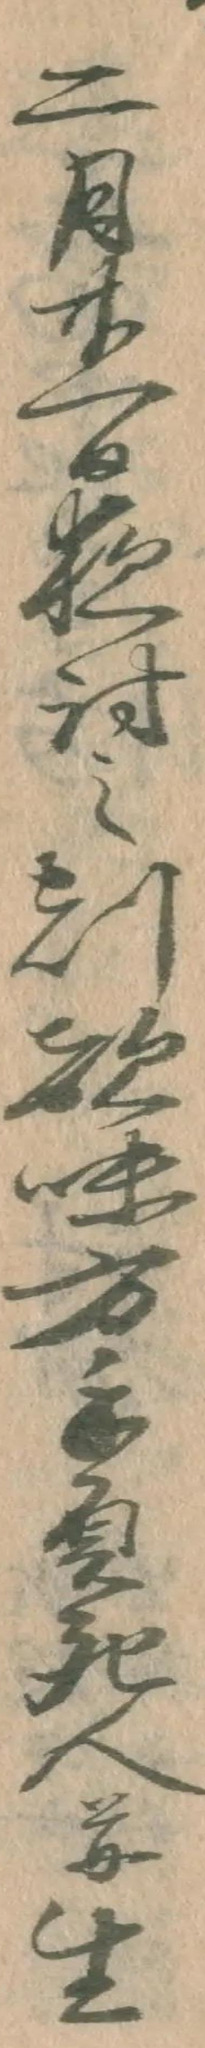二月廿一日夜討之刻敵味方手負死人幷生
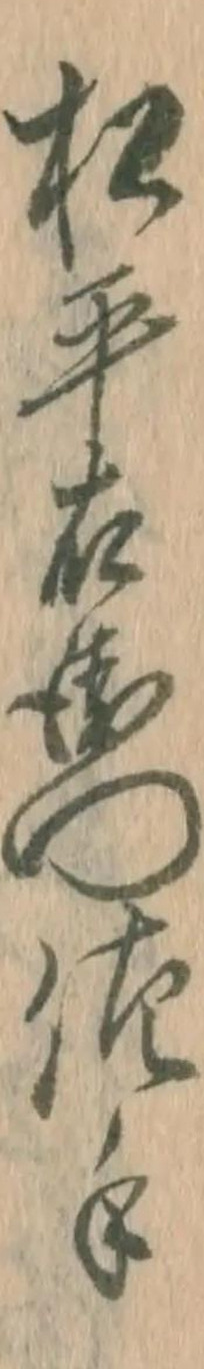松平右衛門佐手
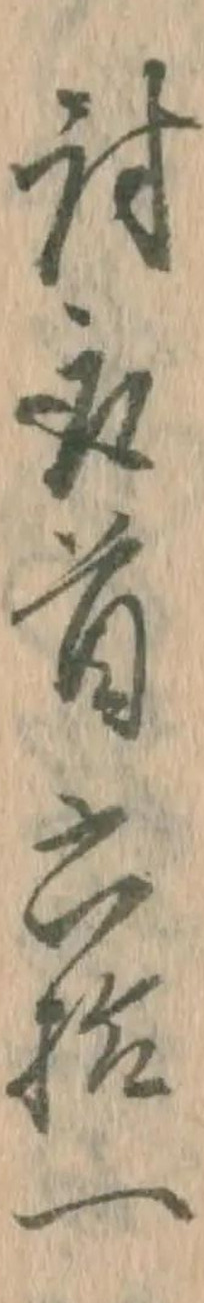討取首六拾一
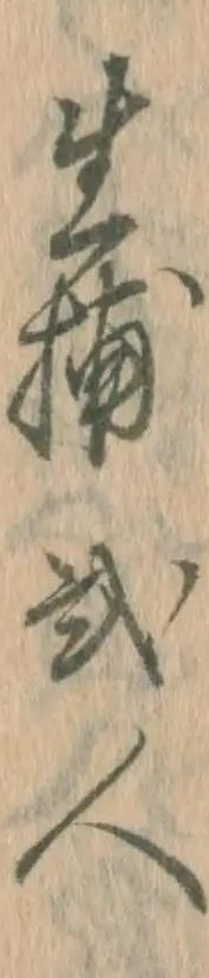生捕弐人
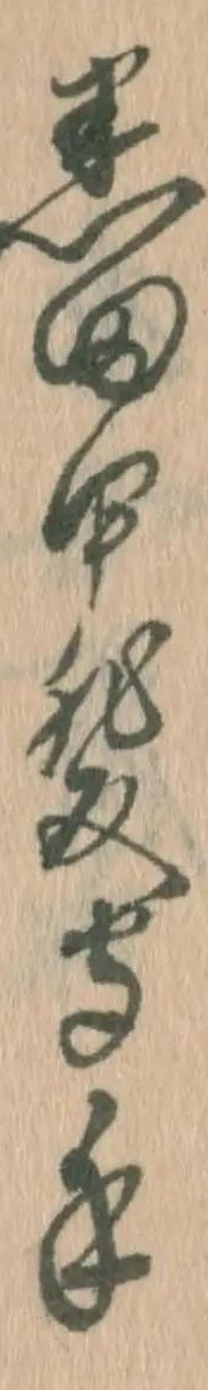黒田甲斐守手
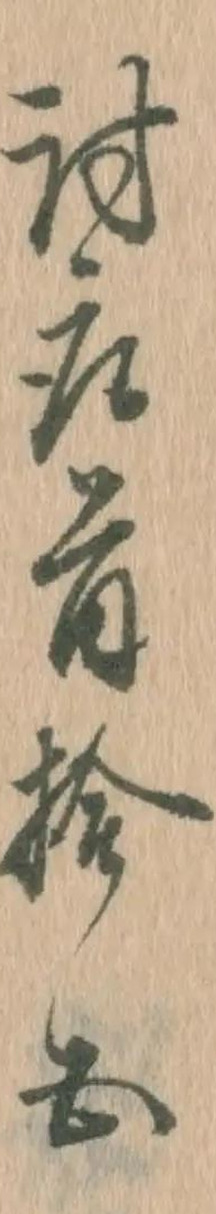討取首拾五
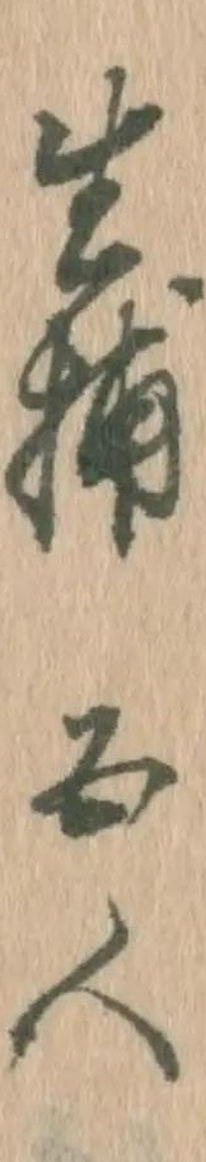生捕五人
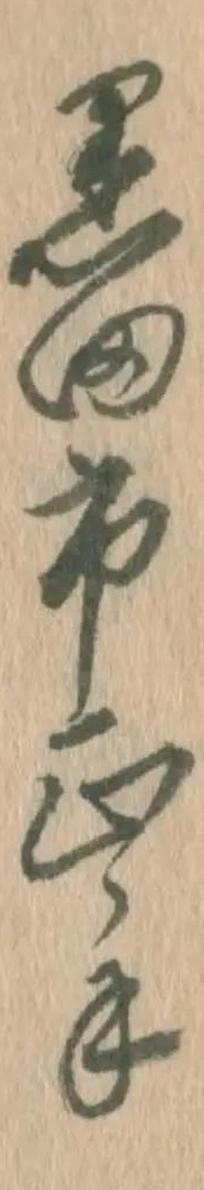黒田市正手
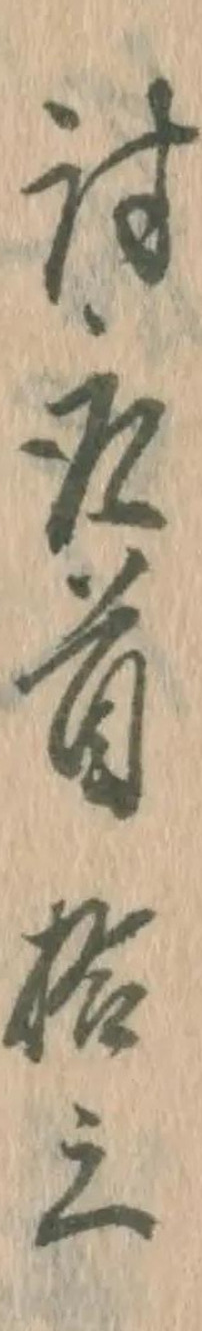討取首拾三
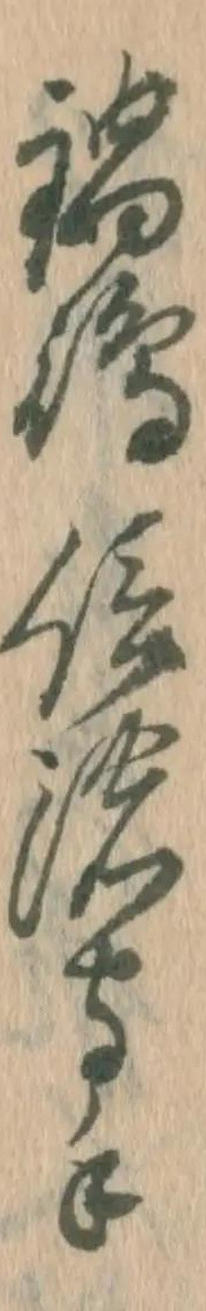鍋島信濃守手
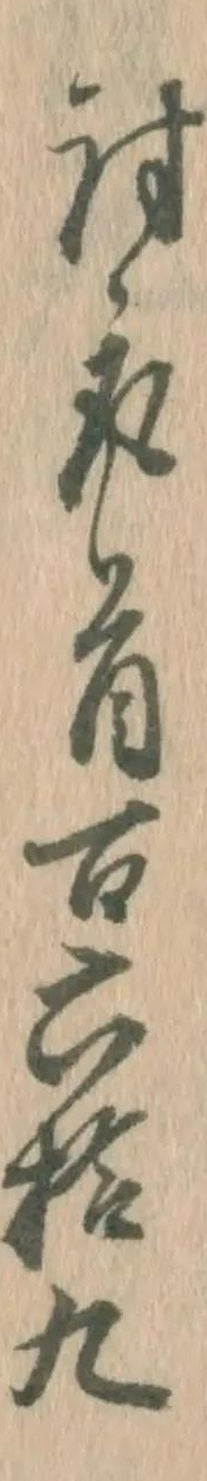討取首百六拾九
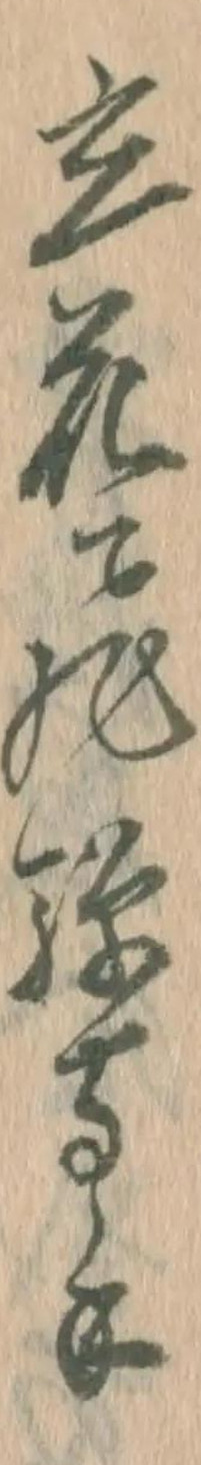立花飛騨守手
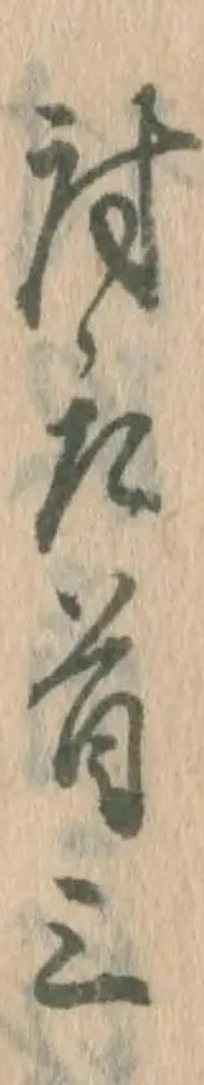討取首三
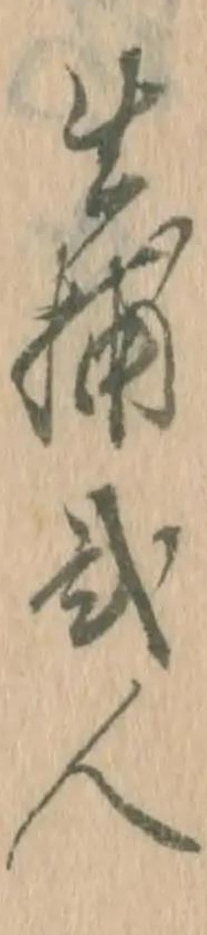生捕弐人

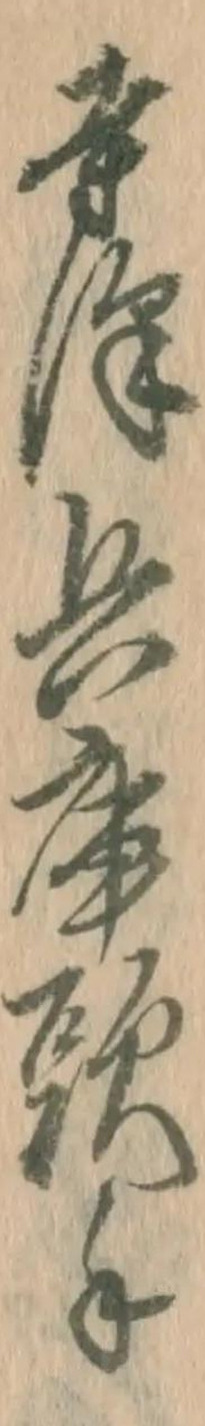寺沢兵庫頭手
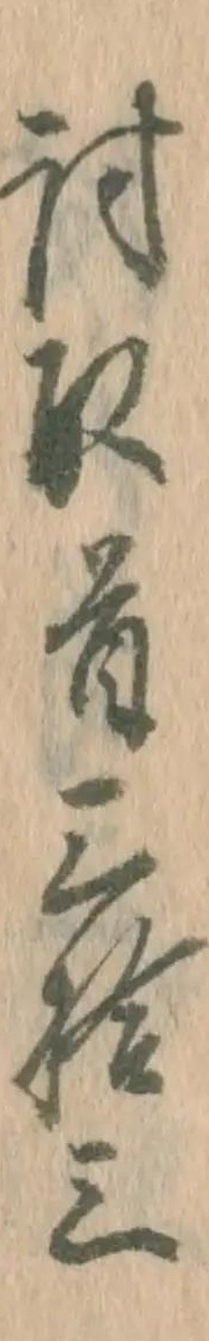討取首三拾三
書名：切支丹御退治記 49巻. [7]
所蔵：国立国会図書館 National Diet Library, JAPAN
